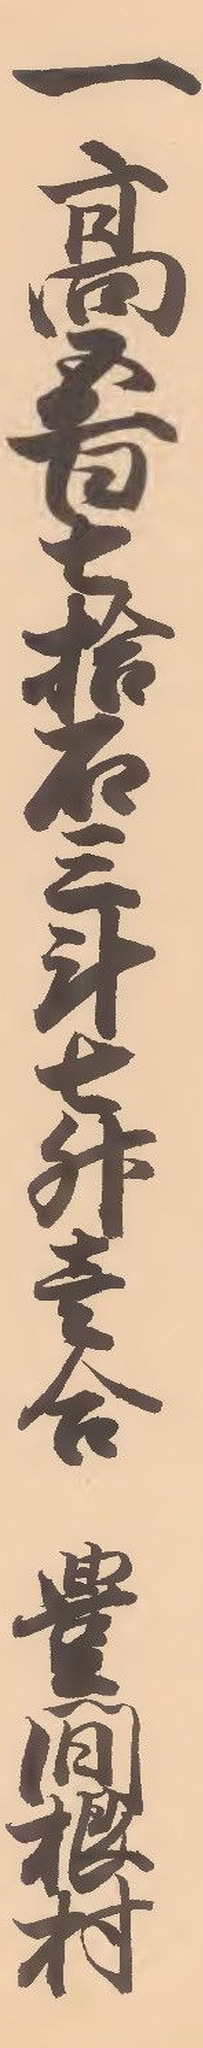一高五百七拾石三斗七升壱合豊間根村
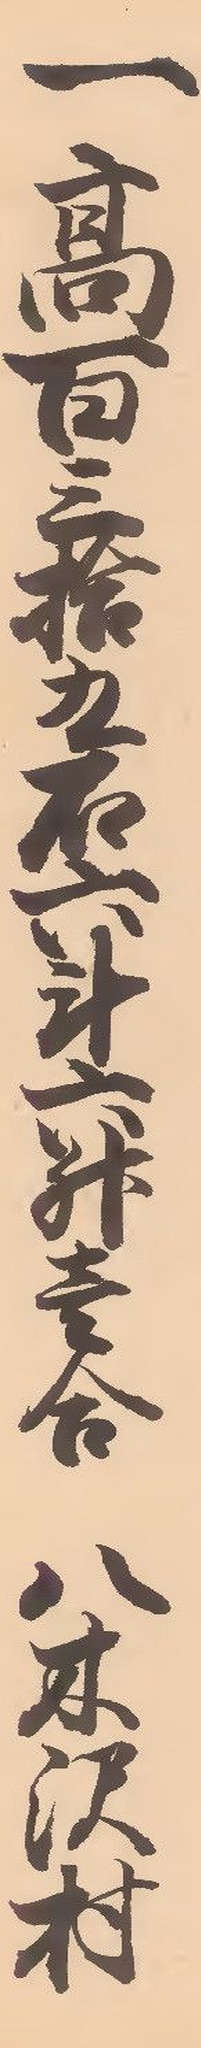一高百三拾九石六斗六升壱合八木沢村

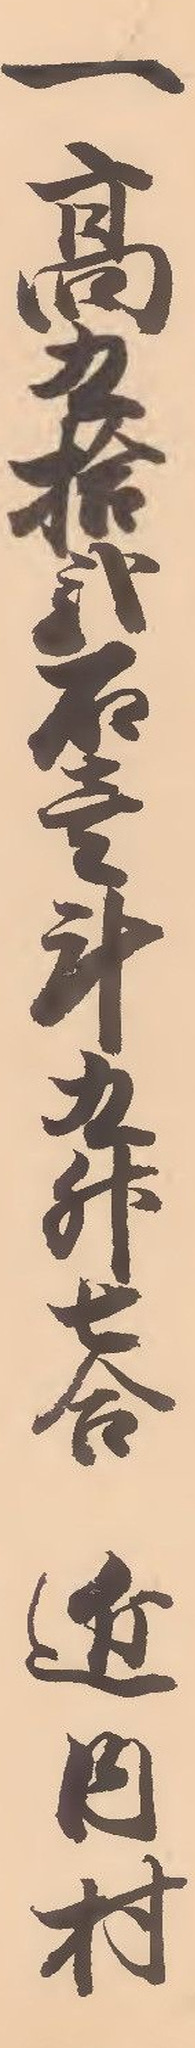一高九拾弐石壱斗九升七合近内村
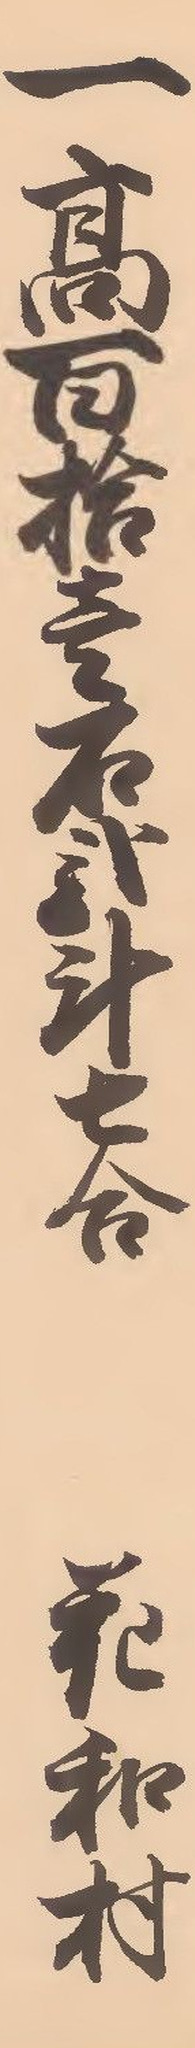一高百拾壱石弐斗七合花和村
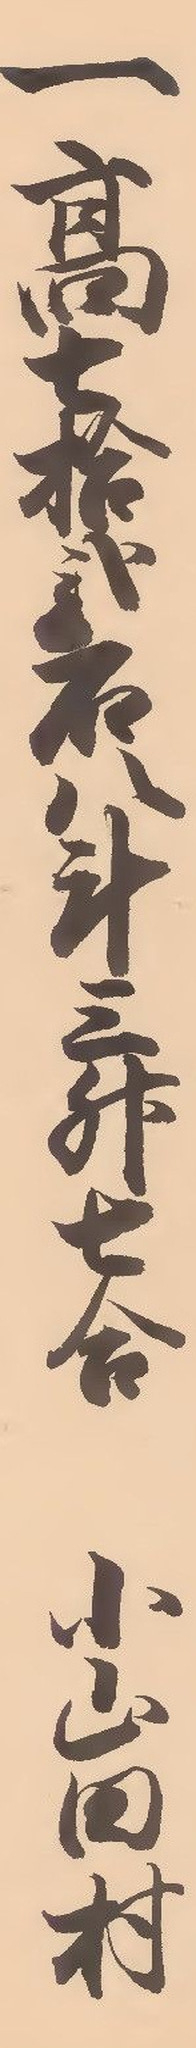一高七拾弐石八斗三升七合小山田村
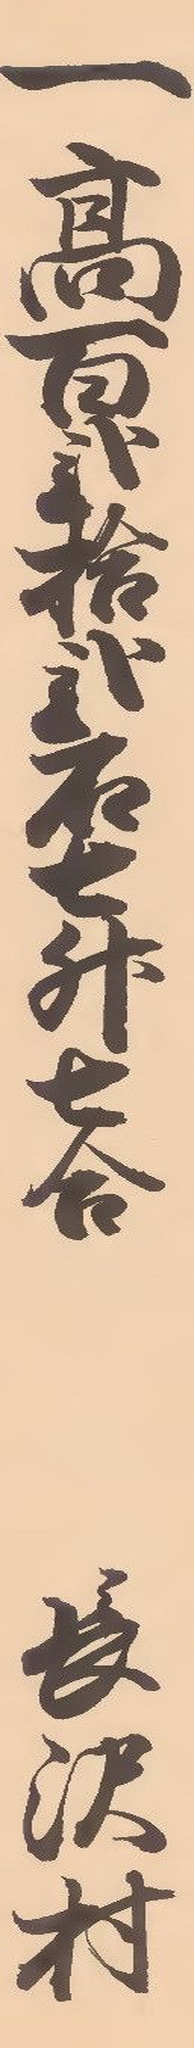一高百弐拾弐石七升七合長沢村
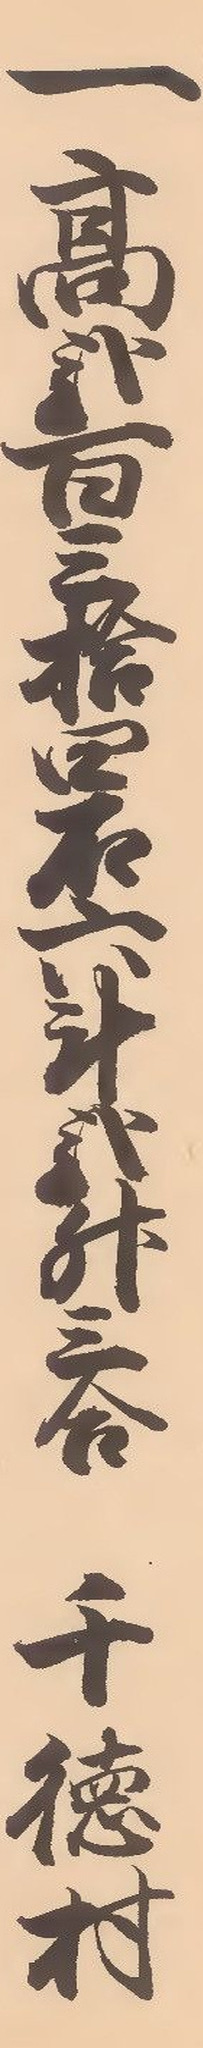一高弐百三拾四石六斗弐升三合千徳村
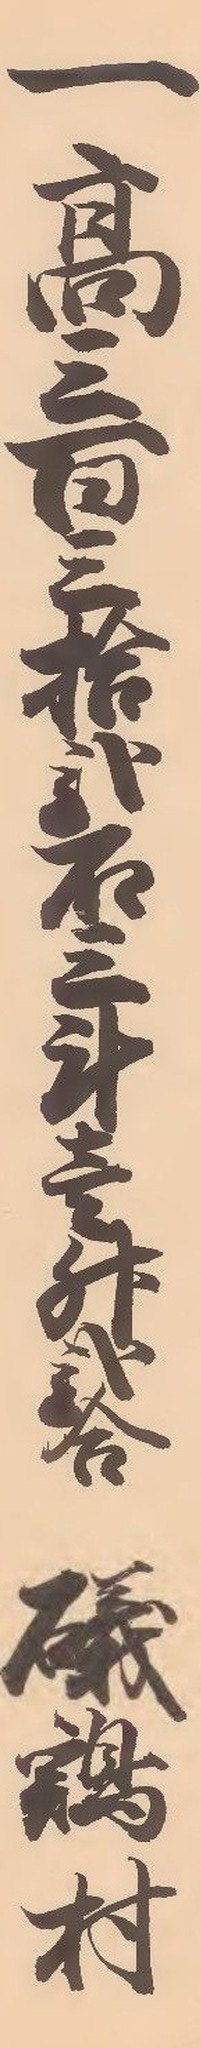一高三百三拾弐石三斗壱升弐合磯鶏村
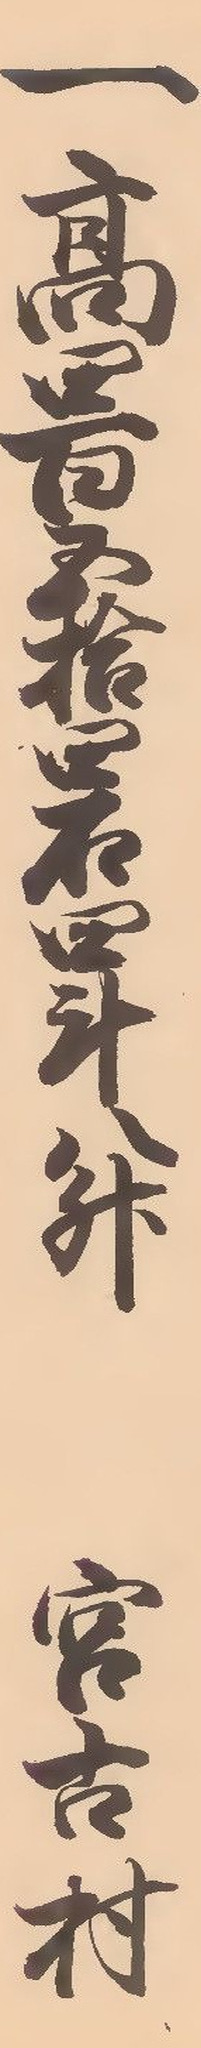一高四百五拾四石四斗八升宮古村

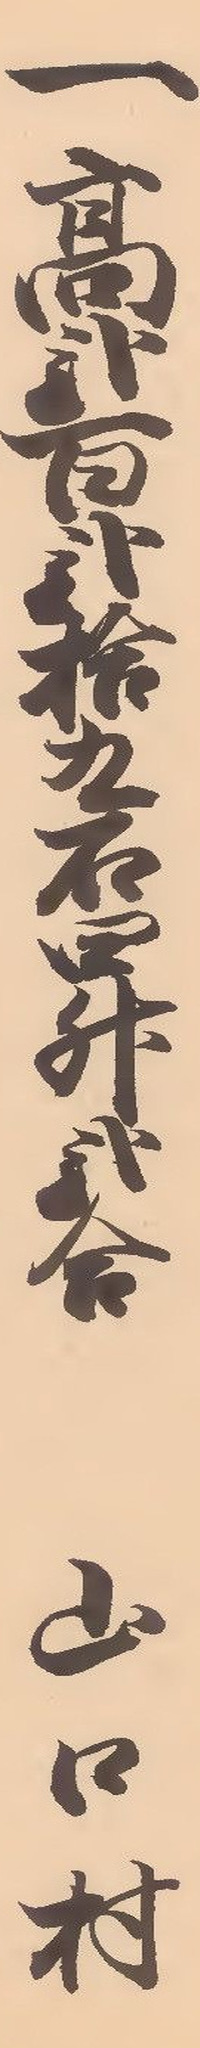一高弐百弐拾九石四升弐合山口村
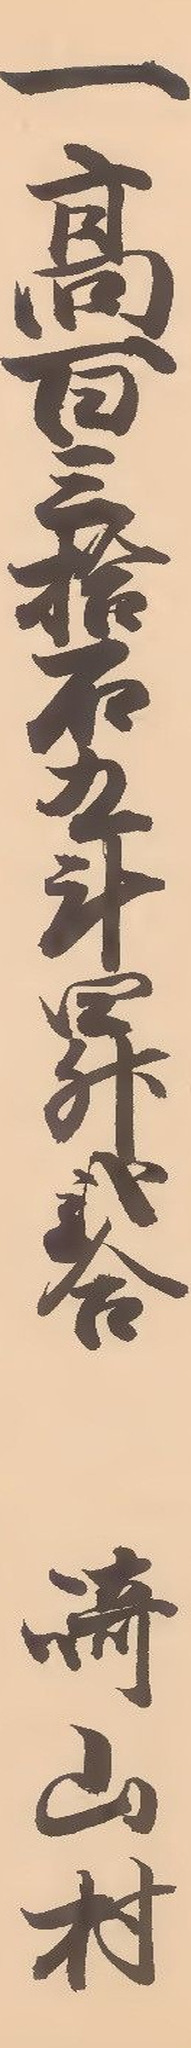一高百三拾石九斗四升弐合崎山村
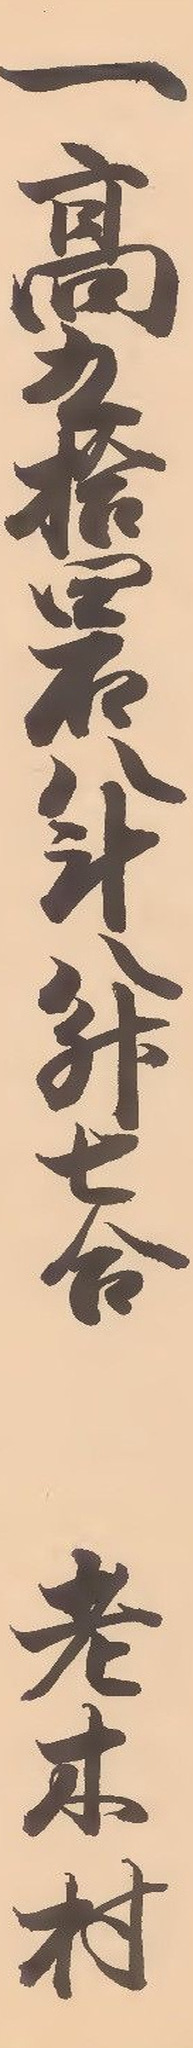一高九拾四石八斗八升七合老木村
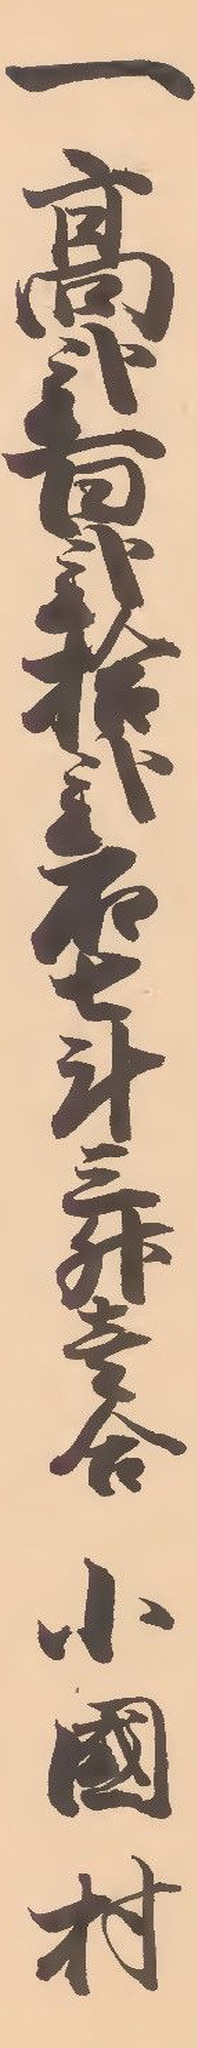一高弐百弐拾弐石七斗三升壱合小国村
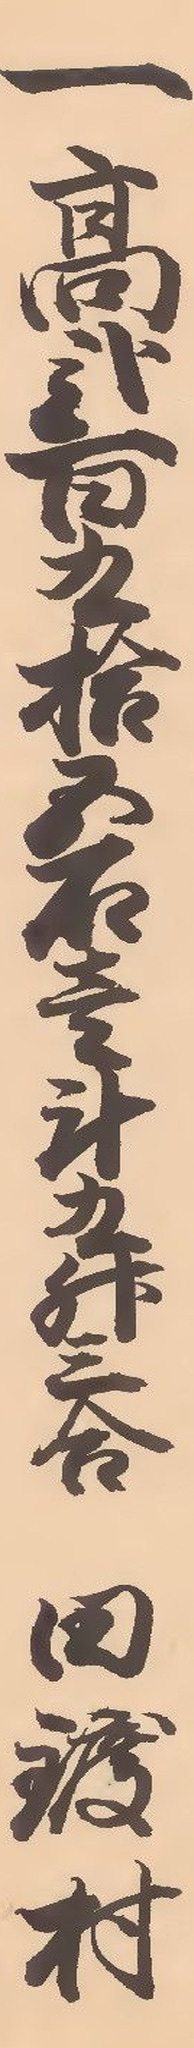一高弐百九拾五石壱斗九升三合田鎖村
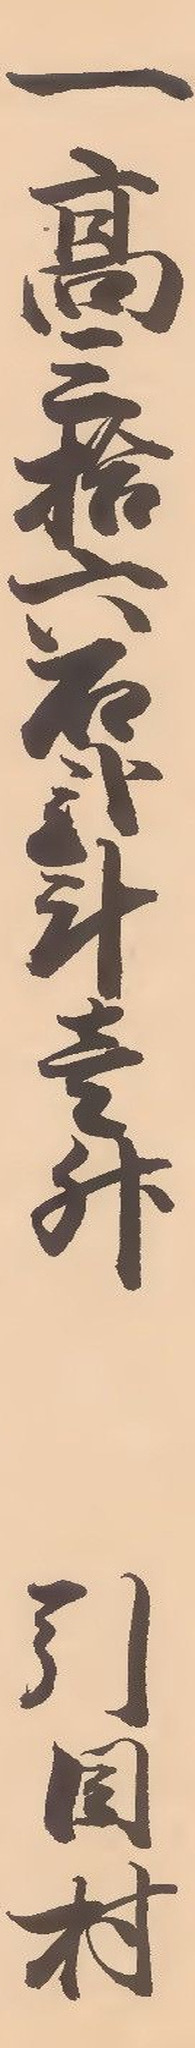一高三拾六石弐斗壱升引目村
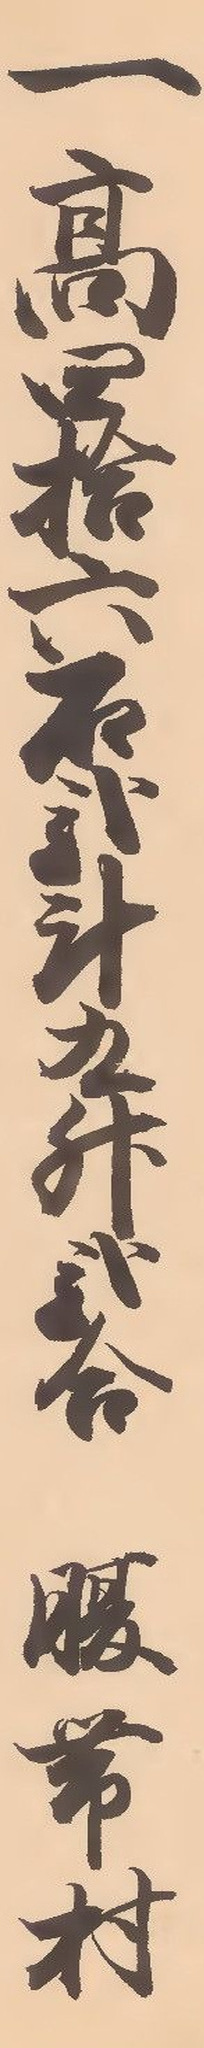一高四拾六石弐斗九升弐合腹帯村
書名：陸奥国郷帳　６
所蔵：国立公文書館 National Archives of Japan
